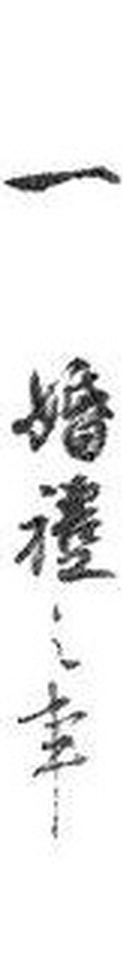一婚礼之事
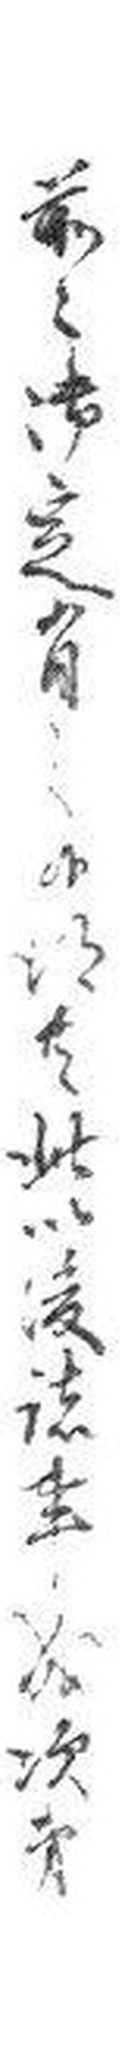前々御定有之候得共此以後諸事成次第
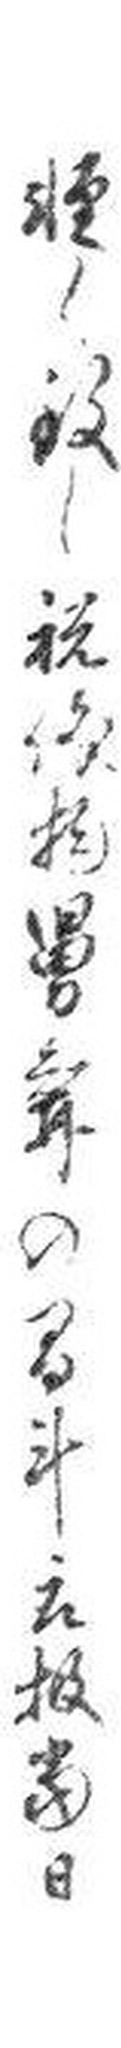軽く致し祝儀物舅聟の間斗取扱当日
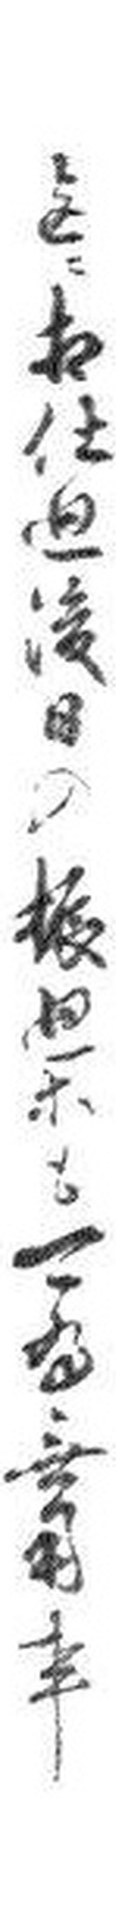迄ニ相仕廻後日の振廻等も可為無用事
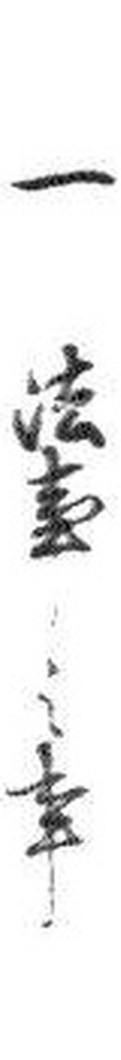一法事之事
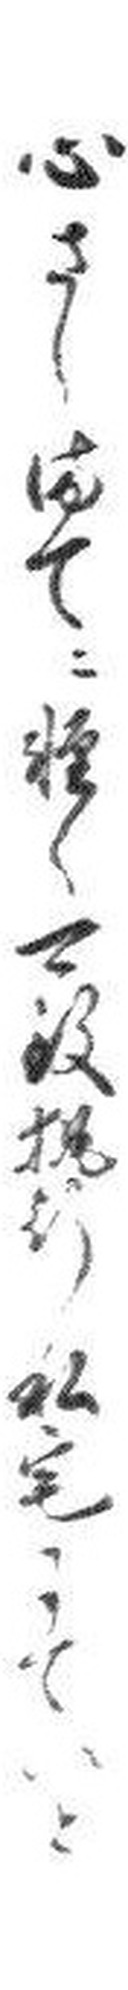心さしまてニ軽く可致執行私宅にていと
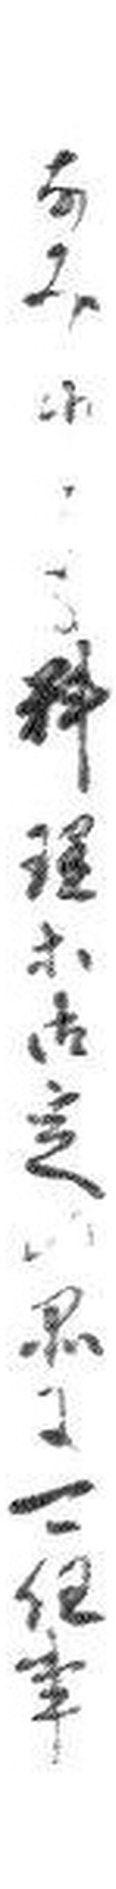なみ候料理等御定の品に可任事
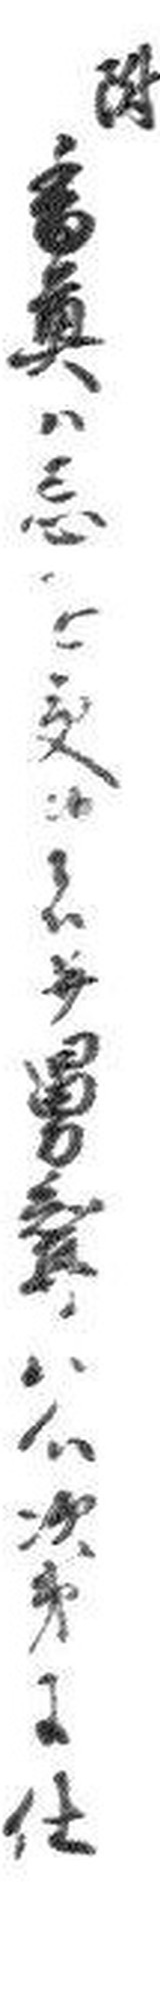香奠ハ忌を受候者并舅聟ハ心次第に仕
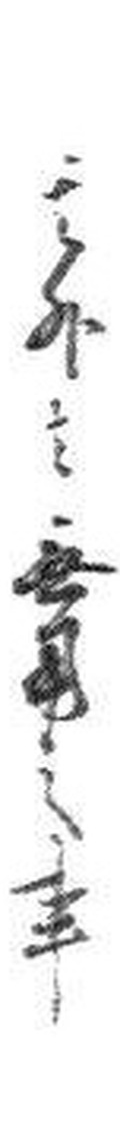其外者無用之事
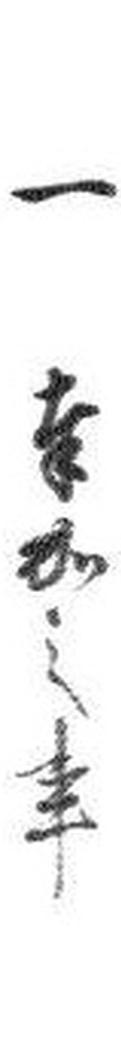一奉加之事
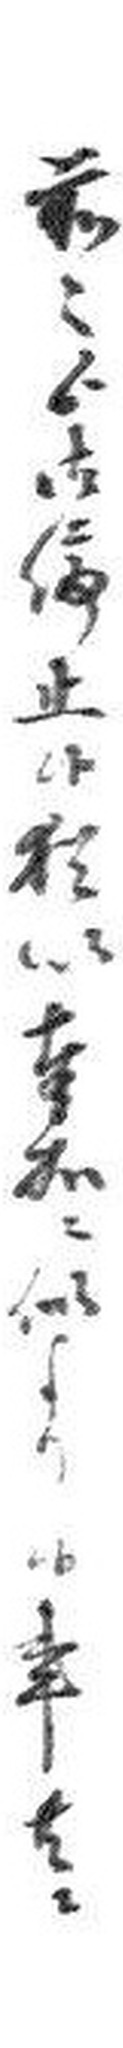前々ゟ御停止候猶以奉加ニ似より候事共ニ
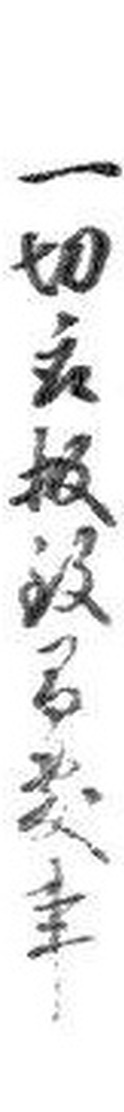一切取扱致間敷事
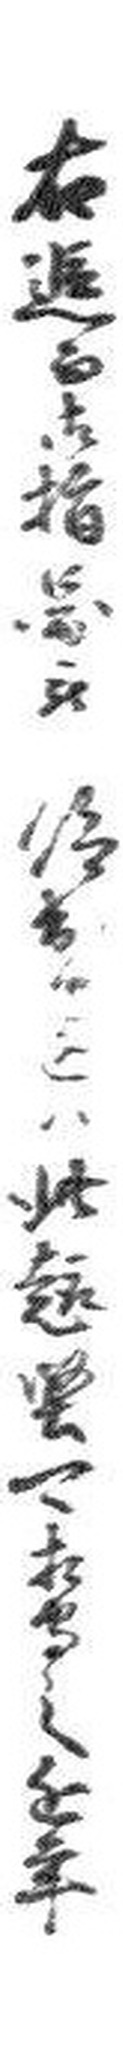右追而御指図被仰出候迄ハ此趣堅可相守之近年
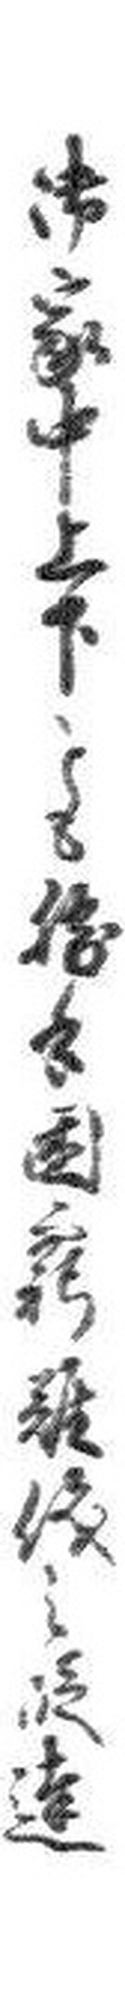御家中上下とも勝手困窮難儀之段達

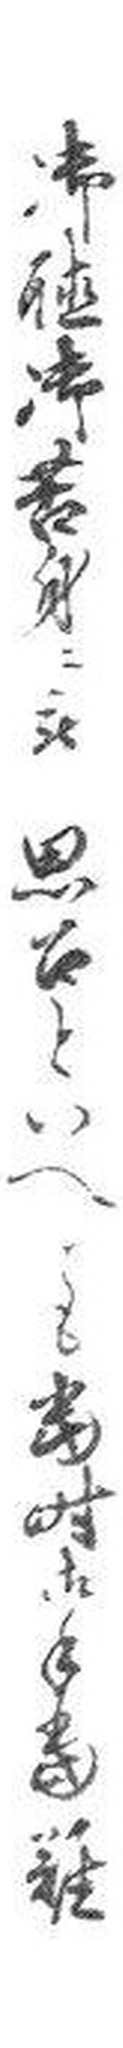御聴御苦身ニ被思召といへとも当時御手当難
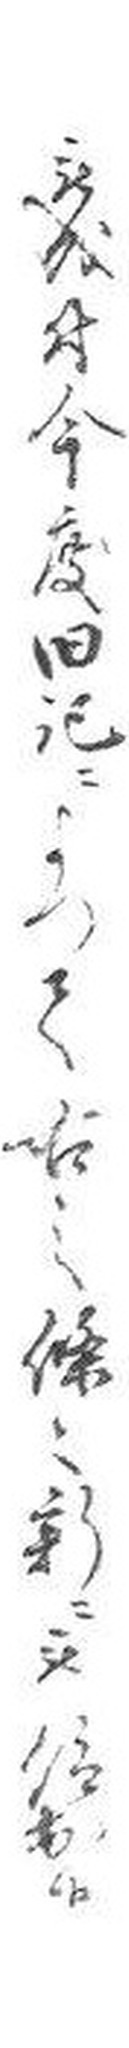被成付今度旧記ニよつて右之條々新ニ被仰出候
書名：家譜 二十八 吉邦公 従宝永七年七月五日到正徳元年十二月
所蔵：福井県文書館 Fukui Prefectural Archives
